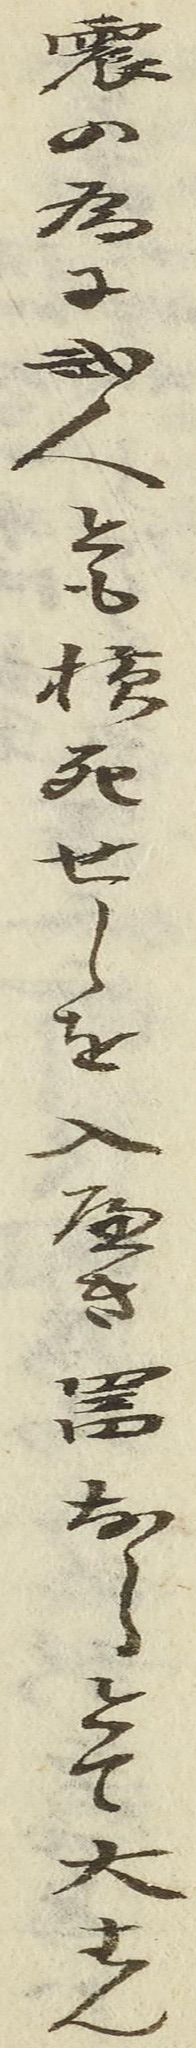震の為に弐人とも横死せしを入へき器なしとて大はん
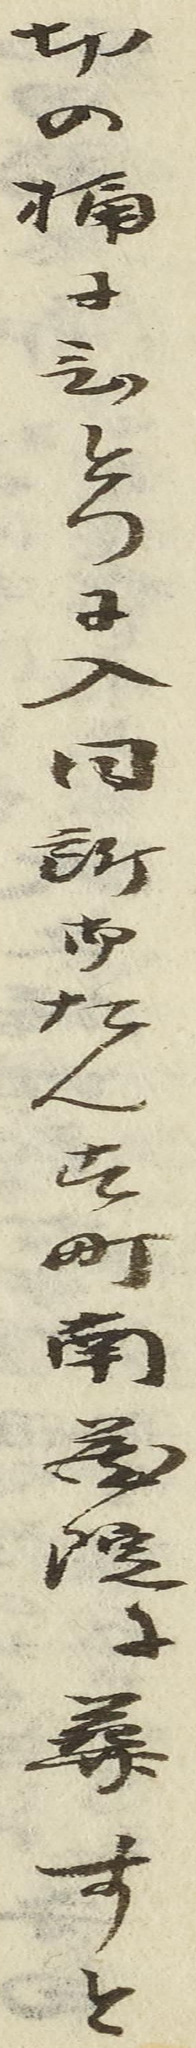切の桶にひとつに入同所御たんす町南蔵院に葬すと
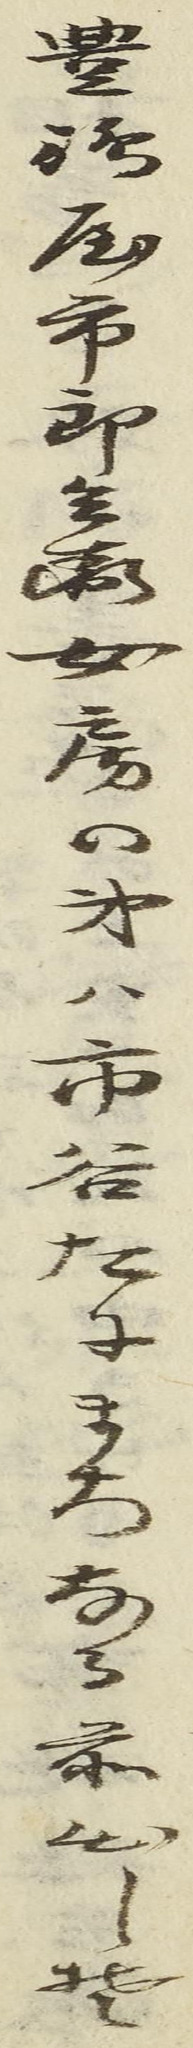豊島屋市郎兵衛女房の弟ハ市谷たにまちなる前出しそ
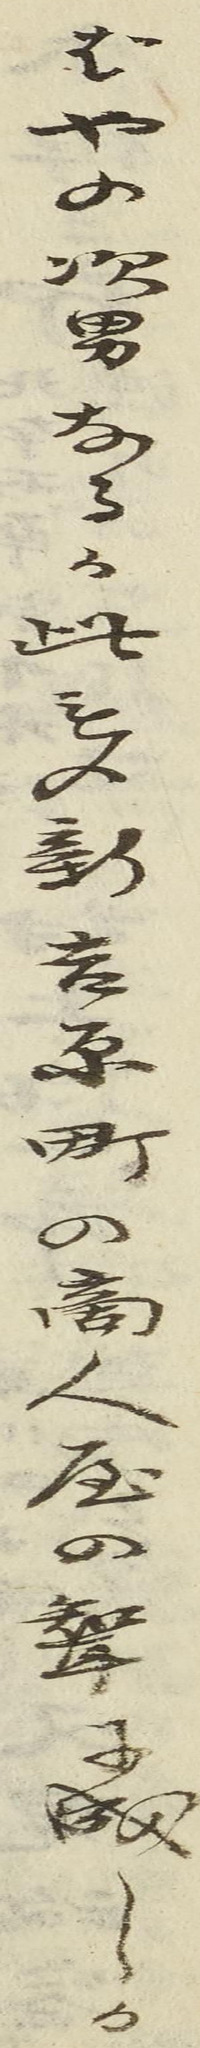ばやの次男なるか此もの新吉原町の商人屋の聟に成しか
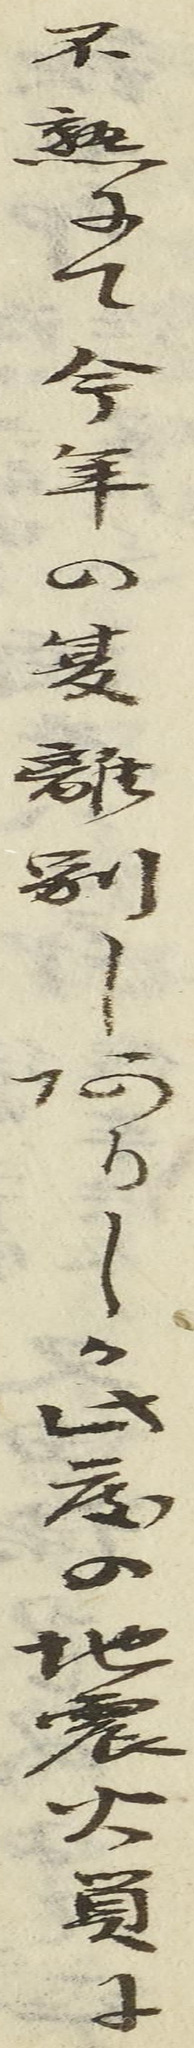不熟にて今年の夏離別しありしか此度の地震火災に
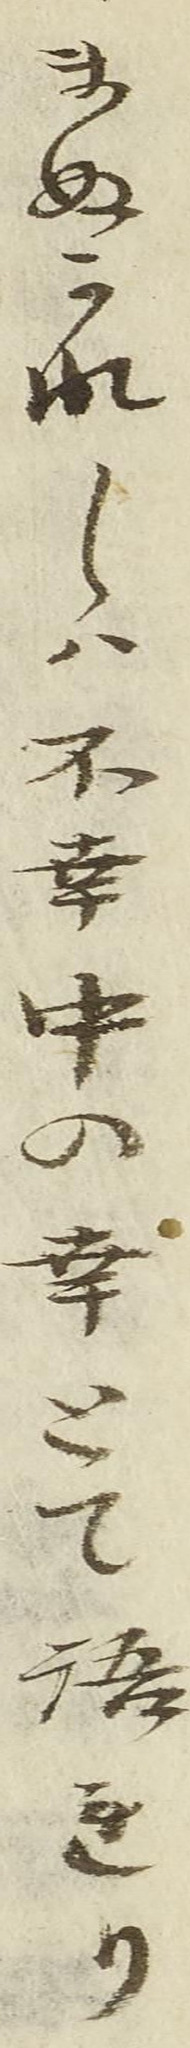まぬかれしハ不幸中の幸とて語れり
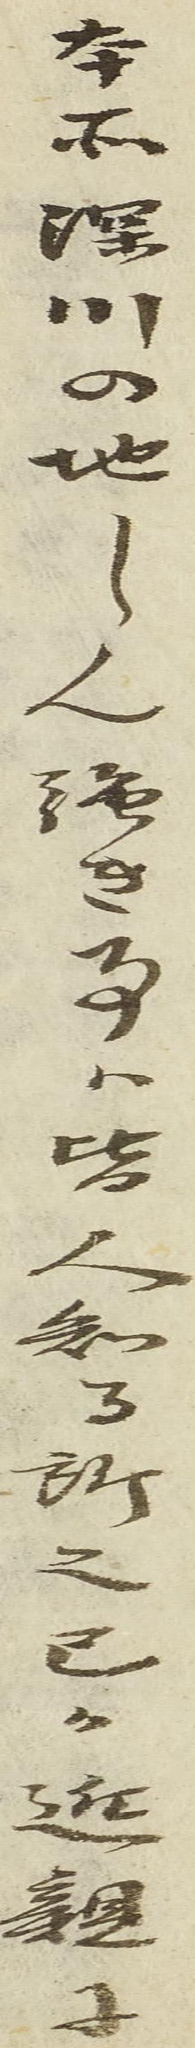本所深川の地しん強き事皆人知る所也己か近親に

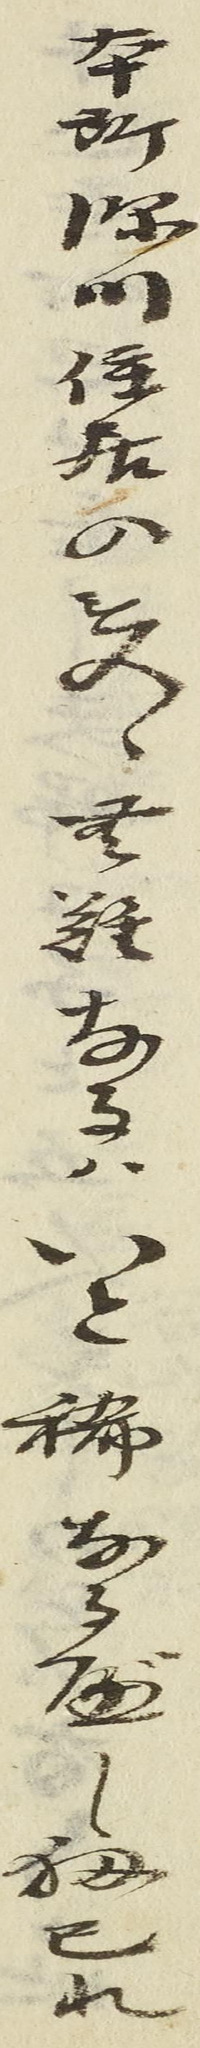本所深川住居のものゝ無難なるハいと稀なるべし扨己れ
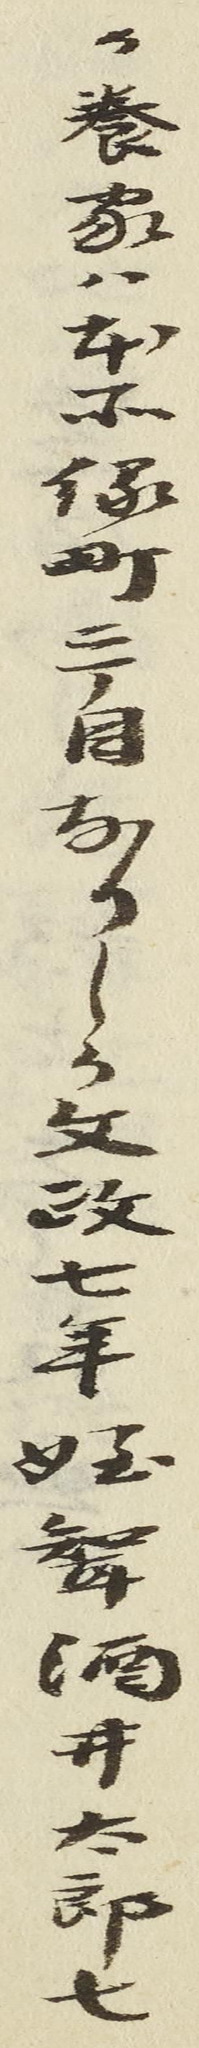か養家ハ本所緑町二丁目なりしか文政七年姪聟酒井太郎七
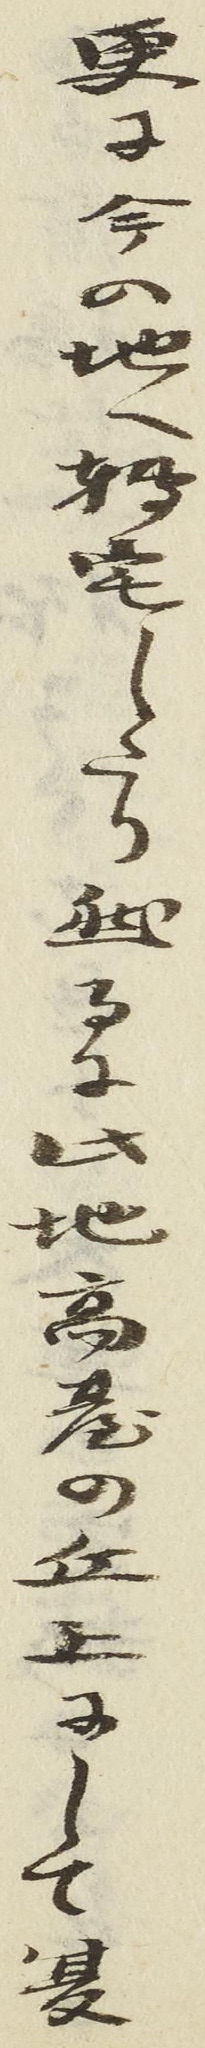更に今の地へ転宅したり然るに此地高台の丘上にして夏
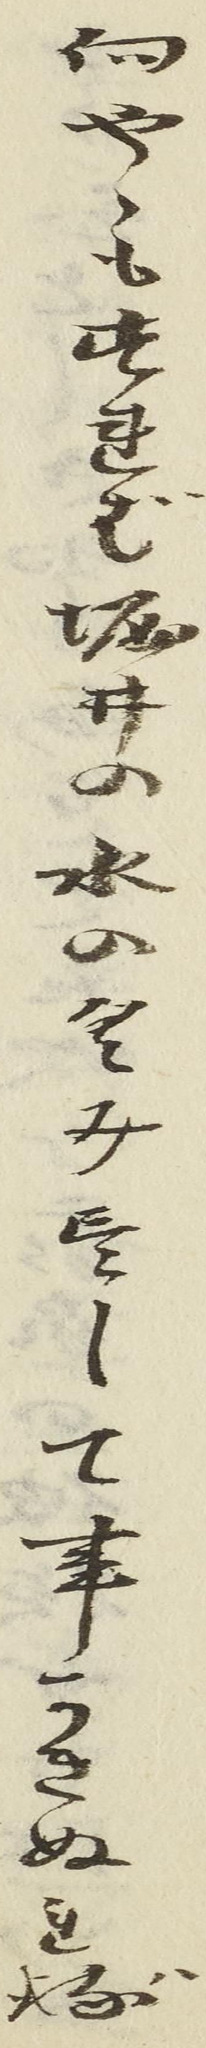向やゝもすれば堀井の水のくみ尽して事うきぬれるハ
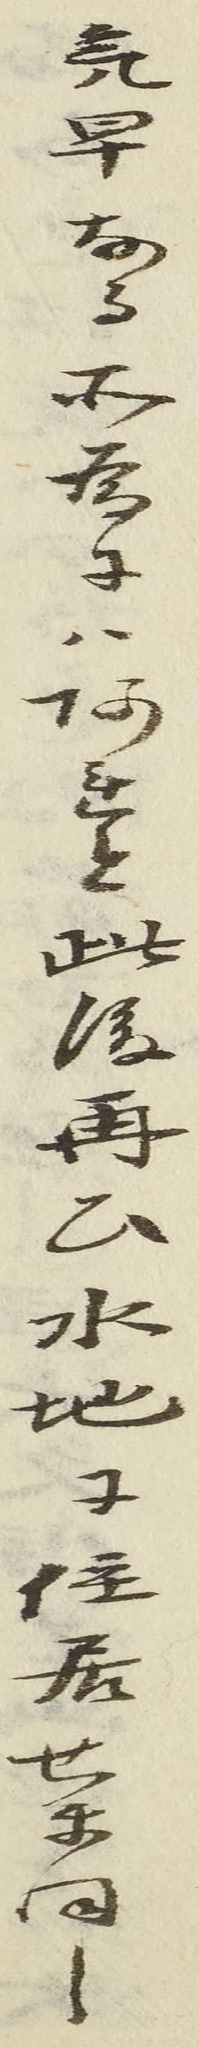気早なる所為にハあれと此後再ひ水地に住居せま同し
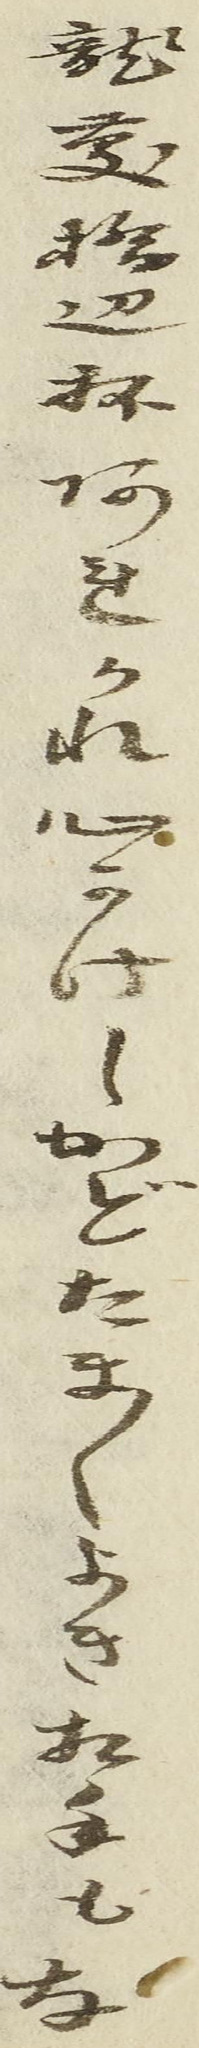龍慶橋辺抔あれかれ心うけしかどたま〳〵よき相手もな
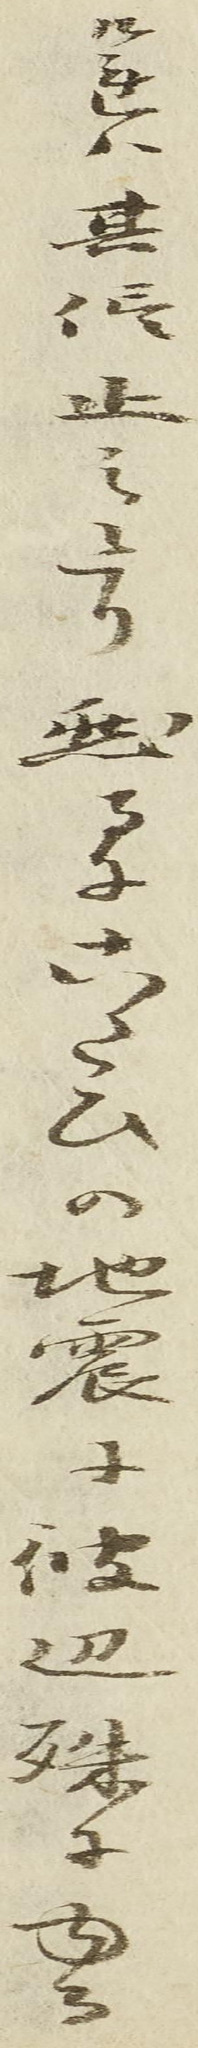けれハ其儘止之たり然るにこたひの地震に彼辺殊にゆる

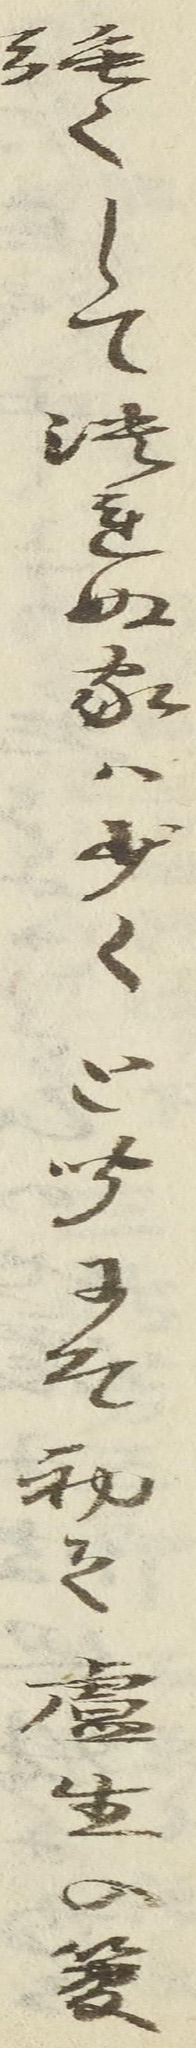強くして潰れぬ家ハ少くと聞にそ初て虚生の夢
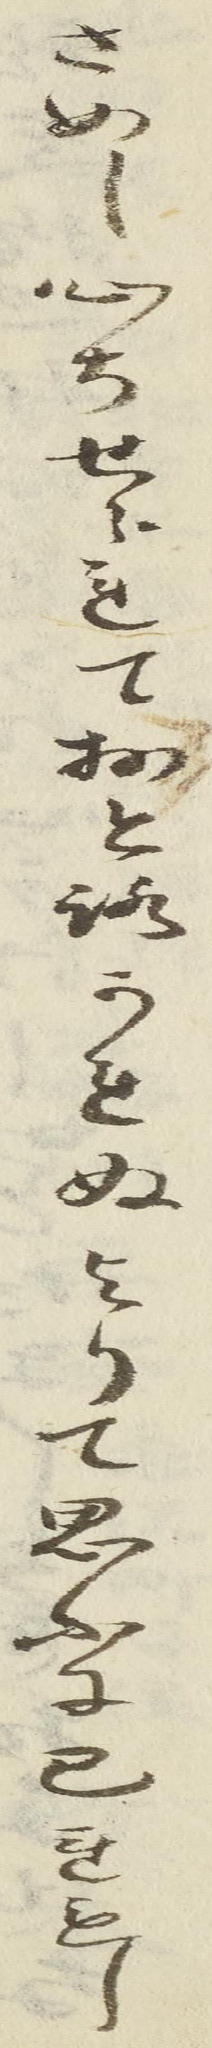さめし心ちせられておとろかもぬよりて思ふに己れもし
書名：那為の後見艸　全
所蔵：東京大学地震研究所図書室 Earthquake Research Institute Library, The University of Tokyo, JAPAN
